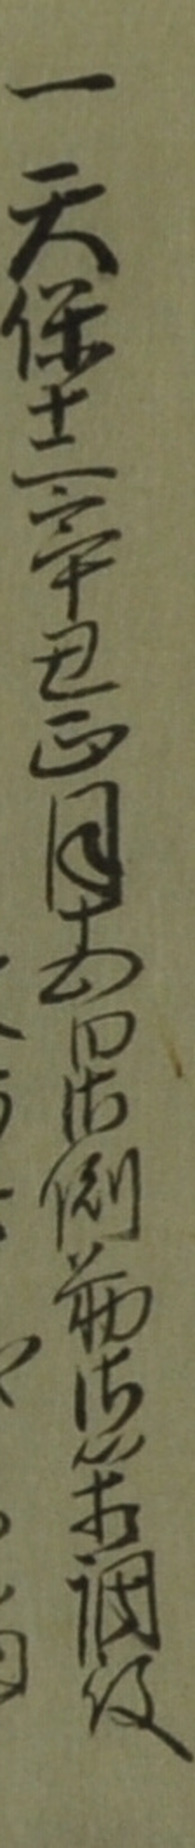一天保十二辛丑正月十五日御側勤御心相調役
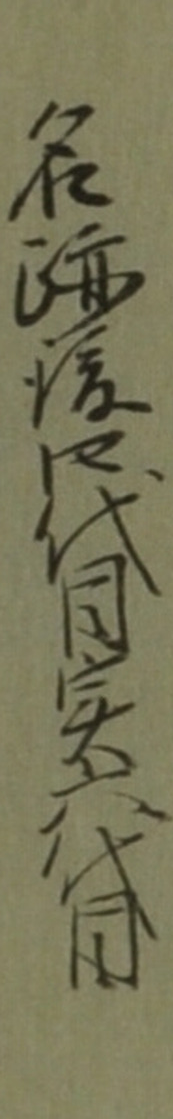名跡後四代目実六代目
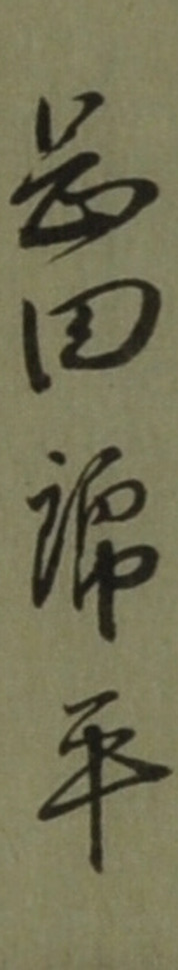岡田錦平
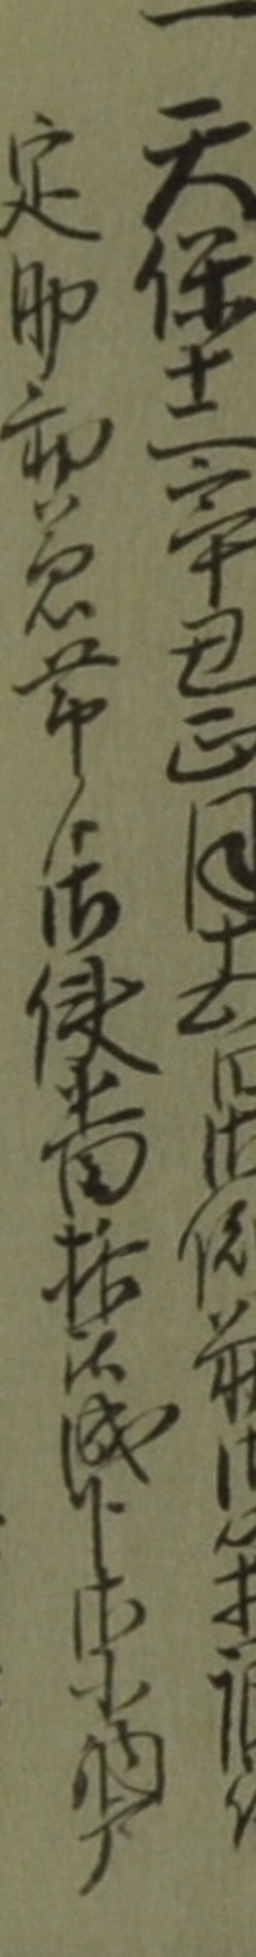定助勤兼帯ゟ御使番格被成下御小納戸
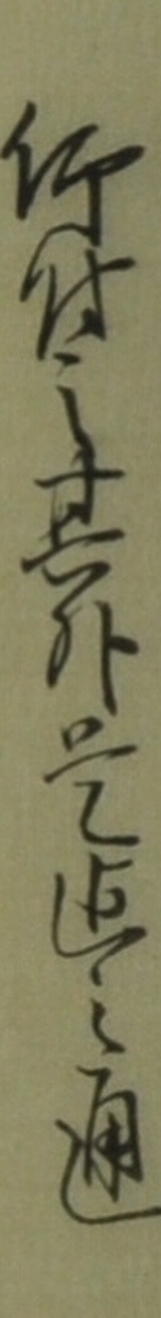仰付之其外是迄之通
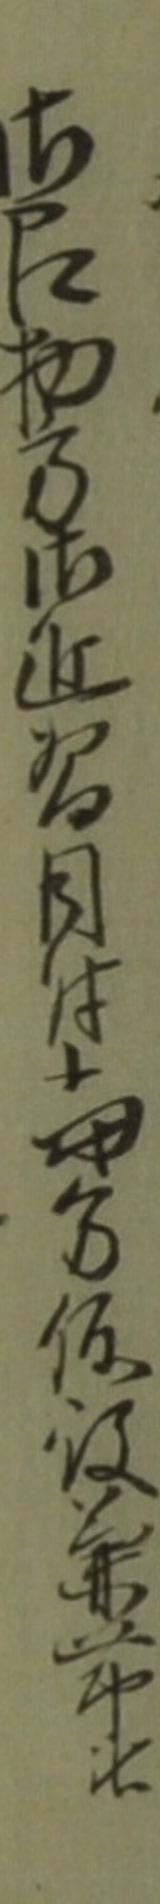御召物方御近習目付当方仮役兼帯被

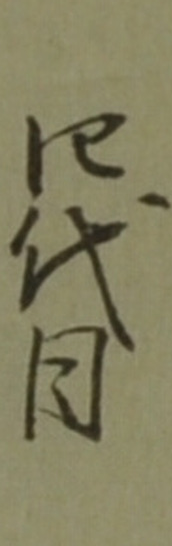四代目
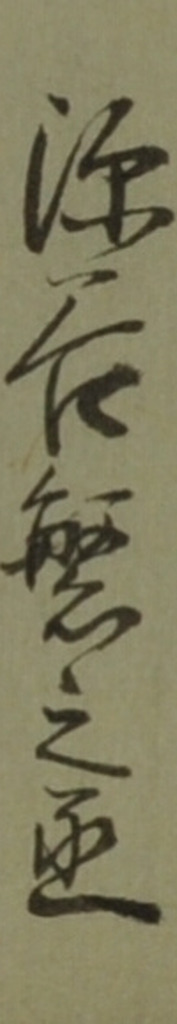深谷繁之丞
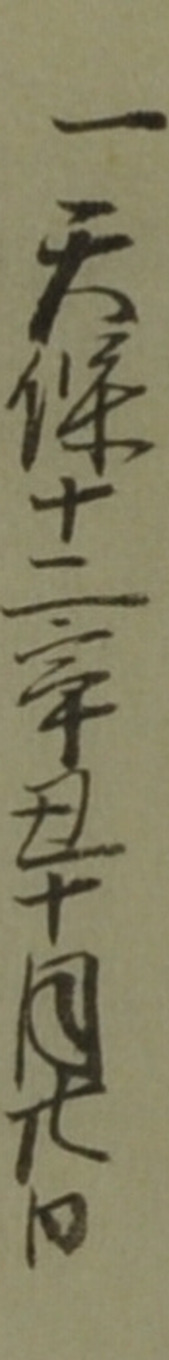一天保十二辛丑十月廿日
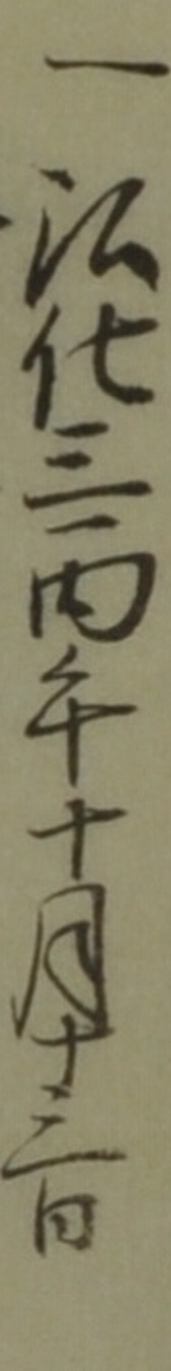一弘化三丙午十月十三日
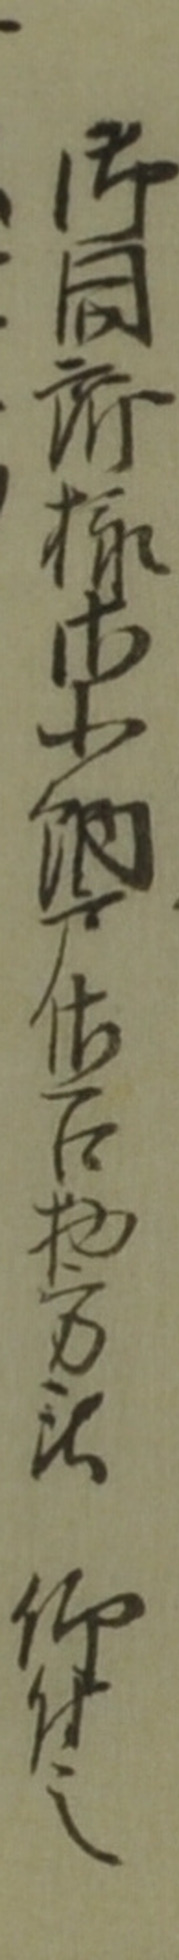御同所様御小納戸御召物方被仰付之
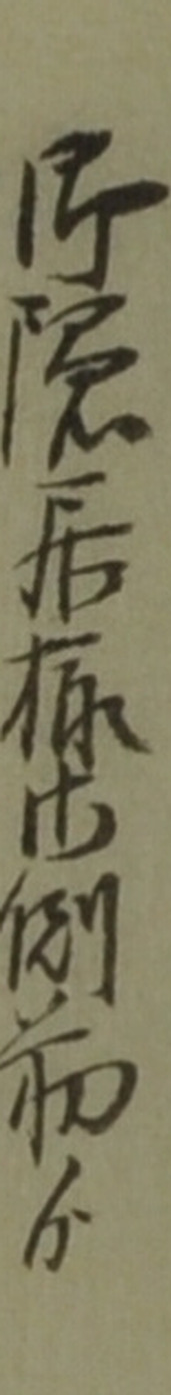御隠居様御側勤ゟ
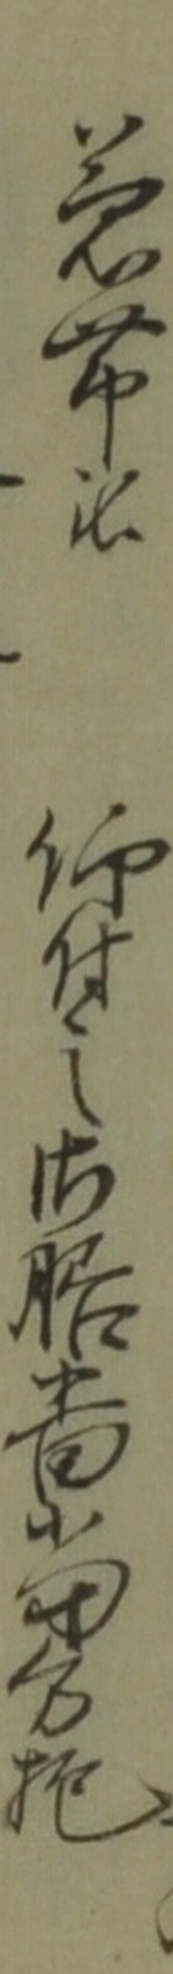兼帯被仰付之御膳番当分抱
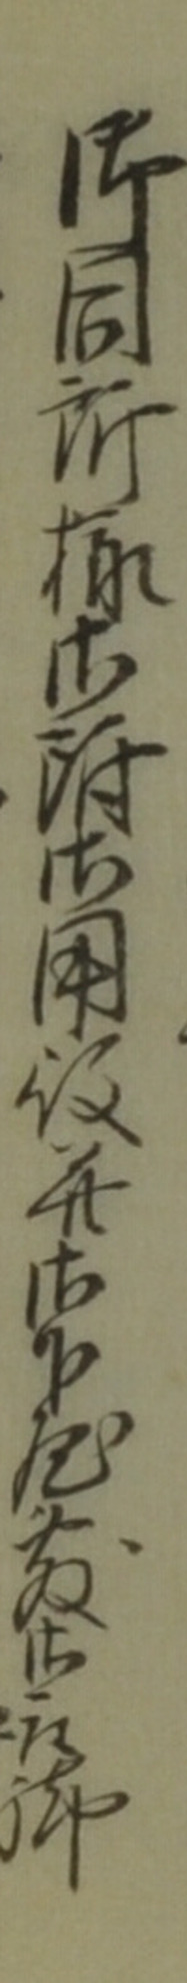御同所様御附御用役并御下屋敷御取締
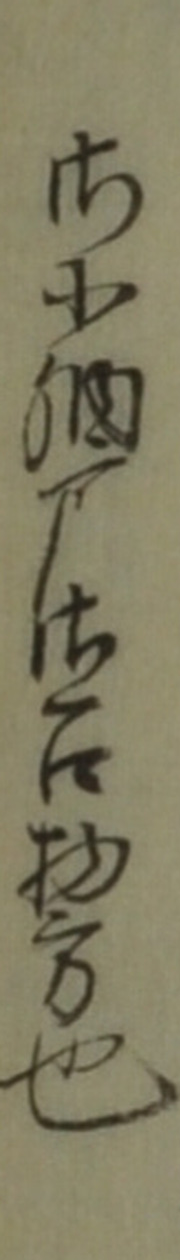御小納戸御召物方也
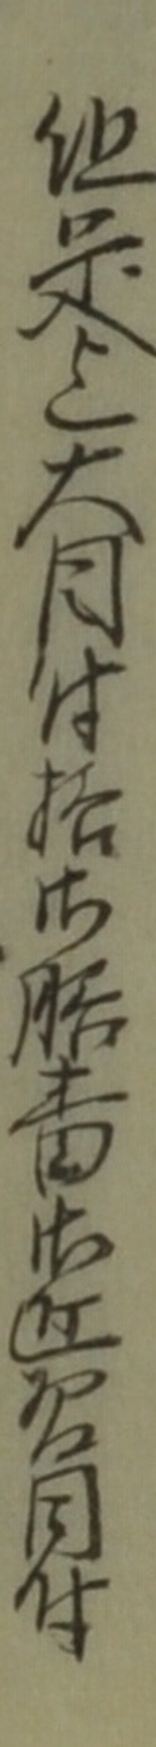但是迄大目付格御膳番御近習目付
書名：諸御役代々録（四）
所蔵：伊那市立高遠町図書館・合同会社AMANE
